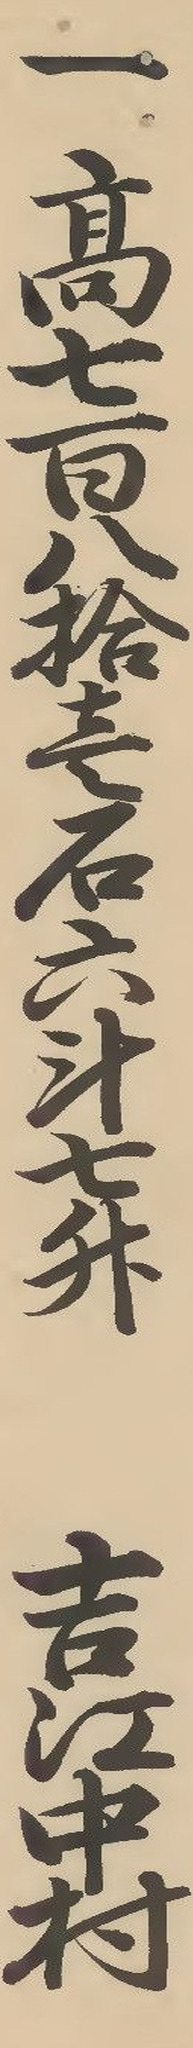一高七百八拾壱石六斗七升吉江中村
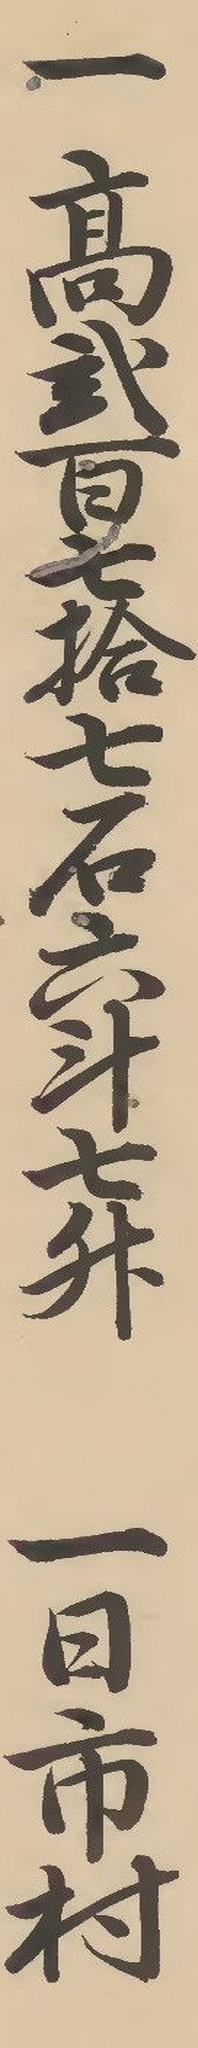一高弐百七拾七石六斗七升一日市村

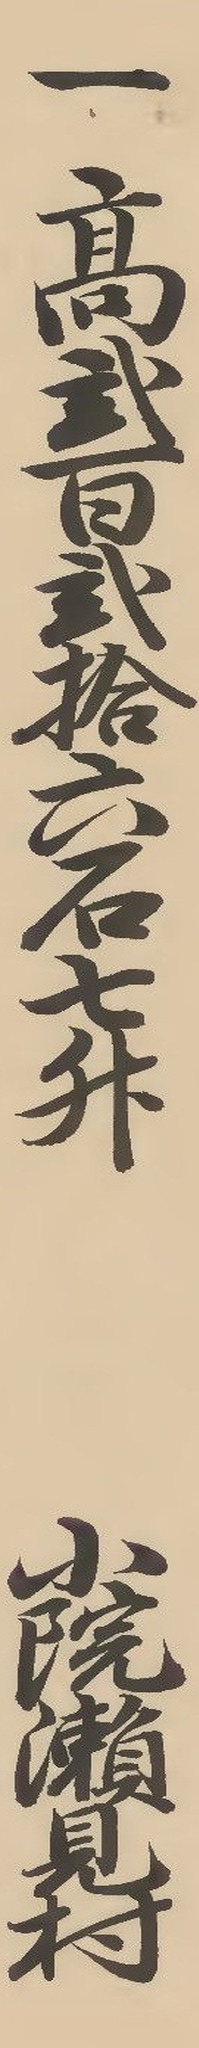一高弐百弐拾六石七升小院瀬見村
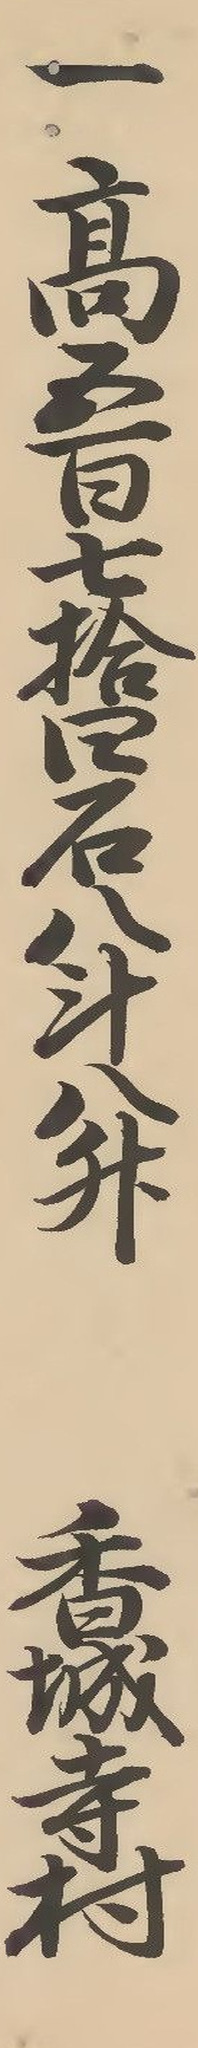一高五百七拾四石八斗八升香城寺村
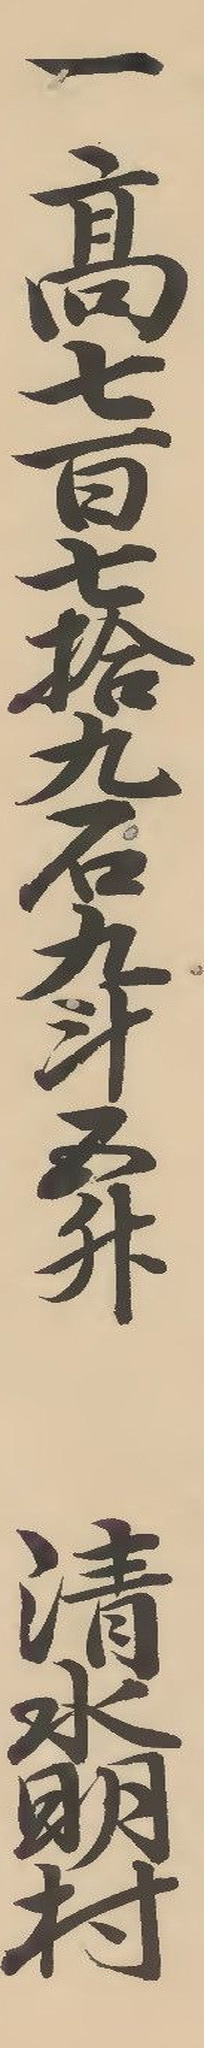一高七百七拾九石九斗五升清水明村
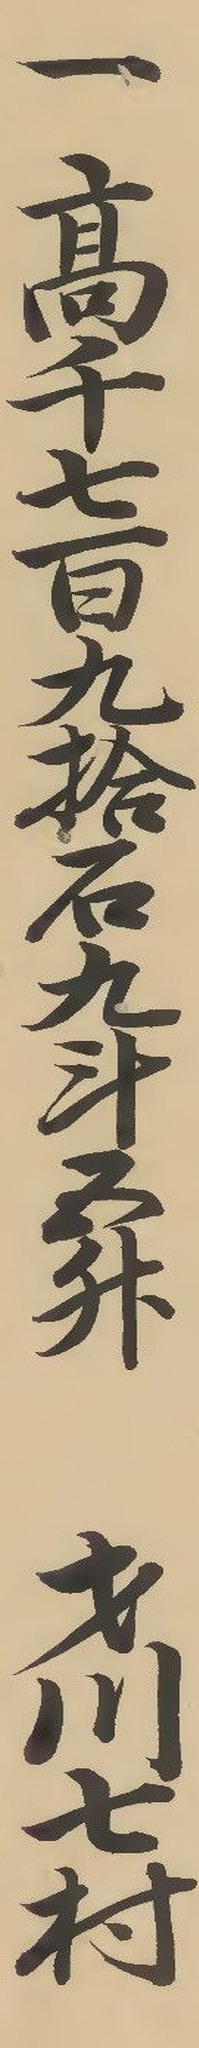一高千七百九拾石九斗五升才川七村
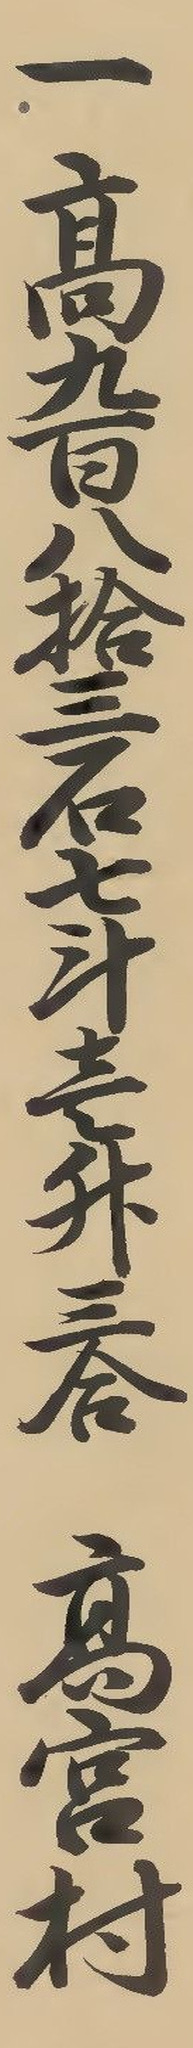一高九百八拾三石七斗壱升三合高宮村
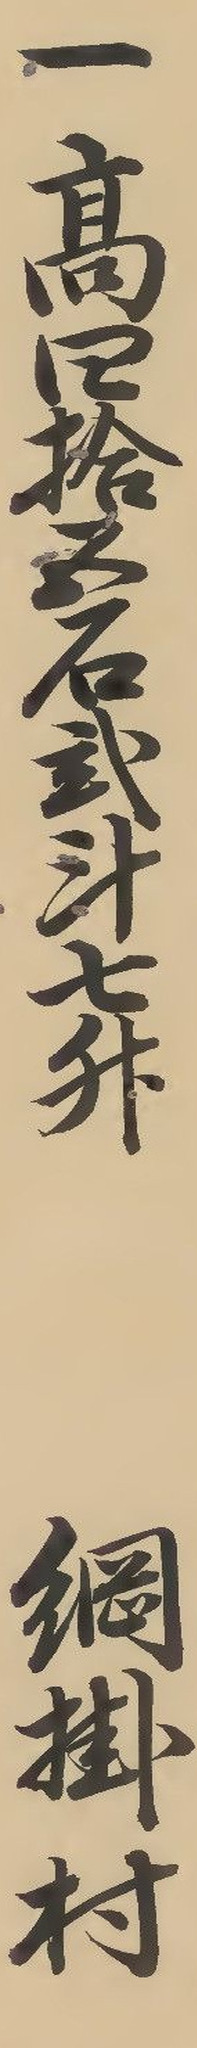一高四拾五石弐斗七升綱掛村

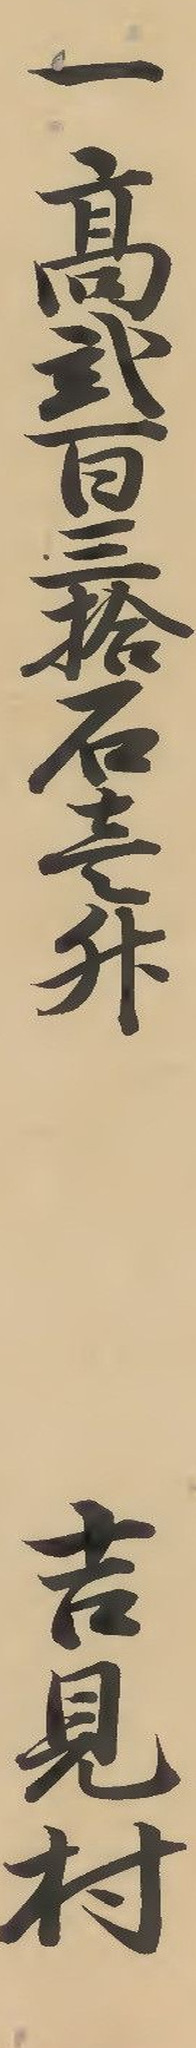一高弐百三拾石壱升吉見村
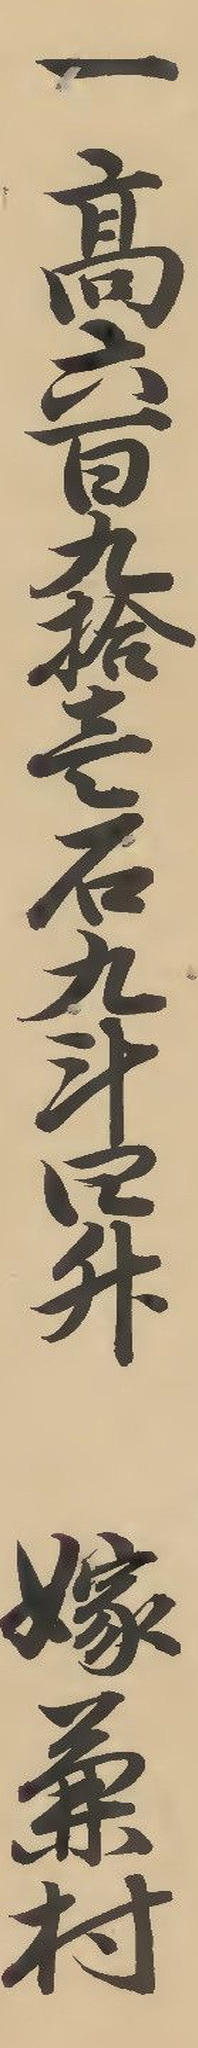一高六百九拾壱石九斗四升嫁兼村
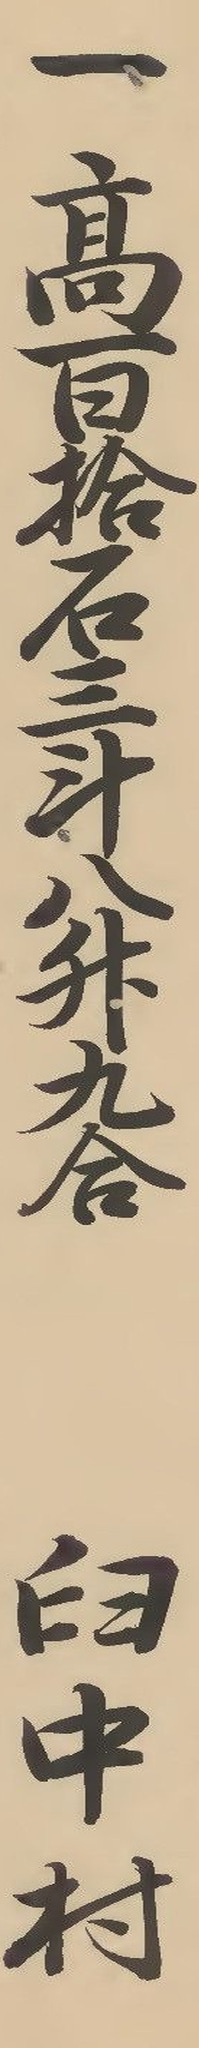一高百拾石三斗八升九合臼中村
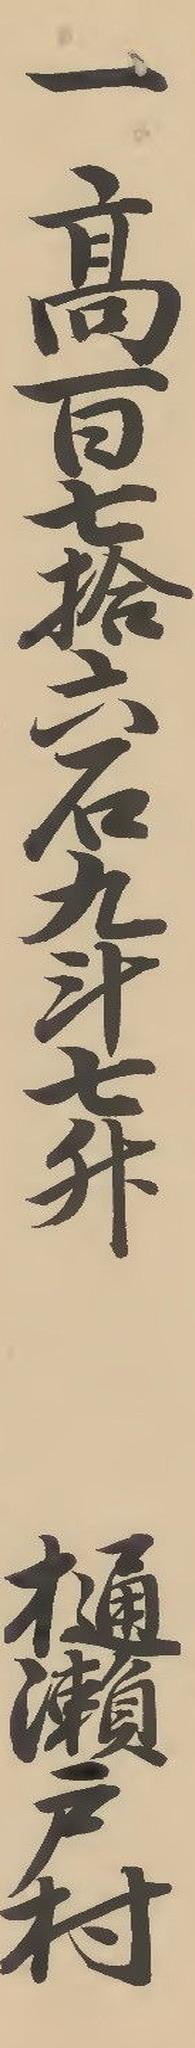一高百七拾六石九斗七升樋瀬戸村
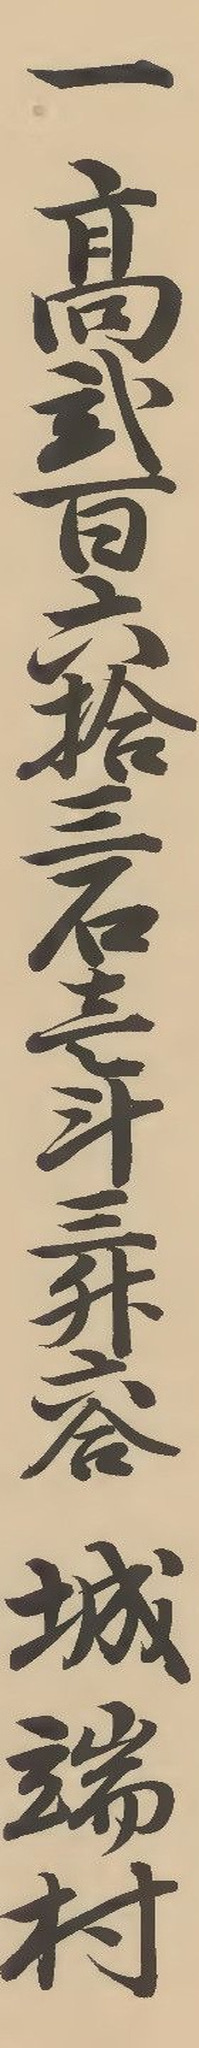一高弐百六拾三石壱斗三升六合城端村
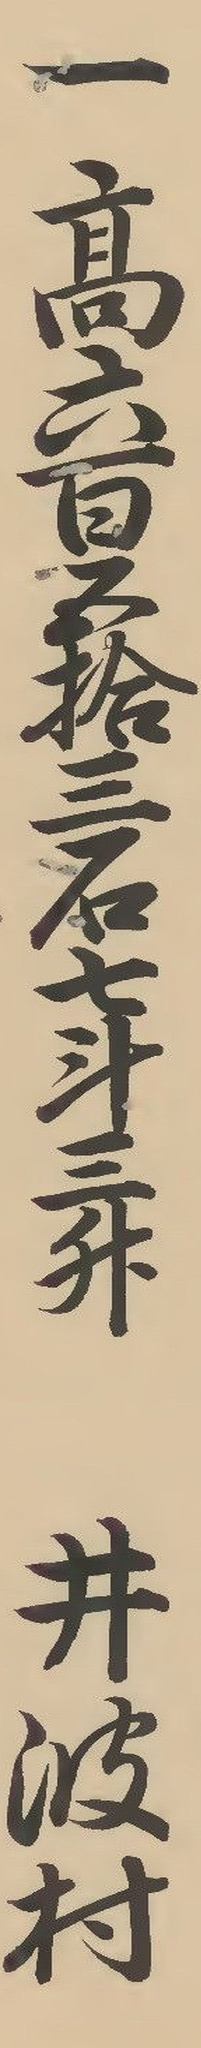一高六百五拾三石七斗三升井波村

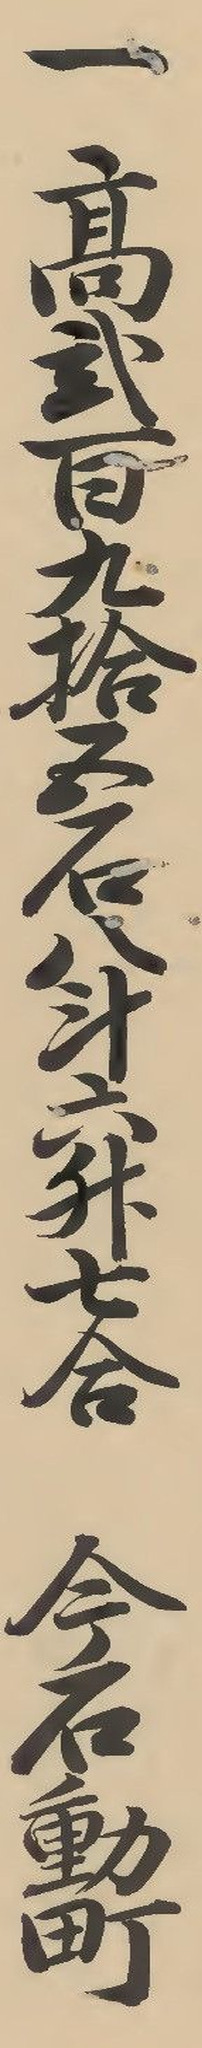一高弐百九拾五石八斗六升七合今石動町
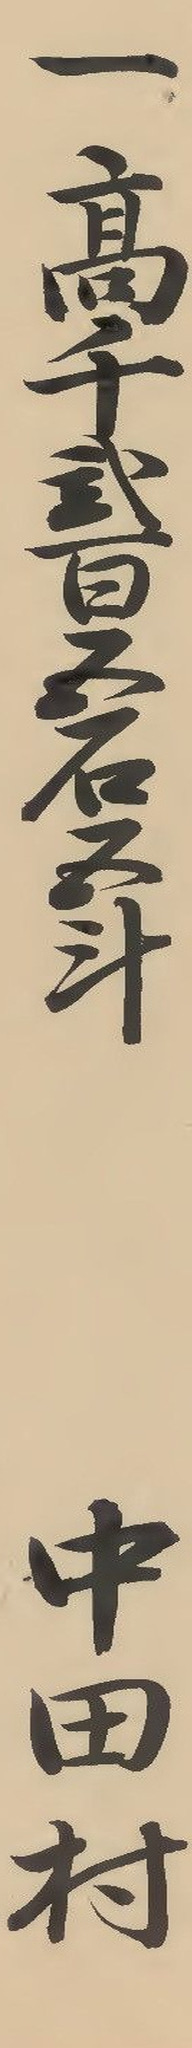一高千弐百五石五斗中田村
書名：越中国郷帳
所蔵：国立公文書館 National Archives of Japan
